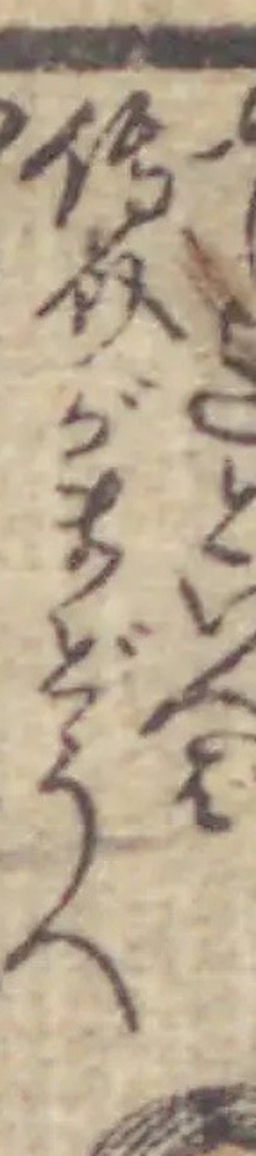伝介がまどうへ
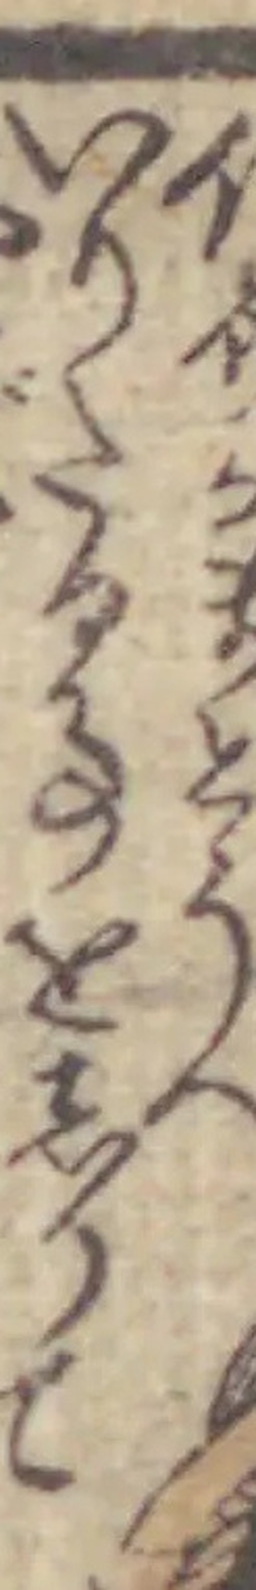いりたる事をしりて
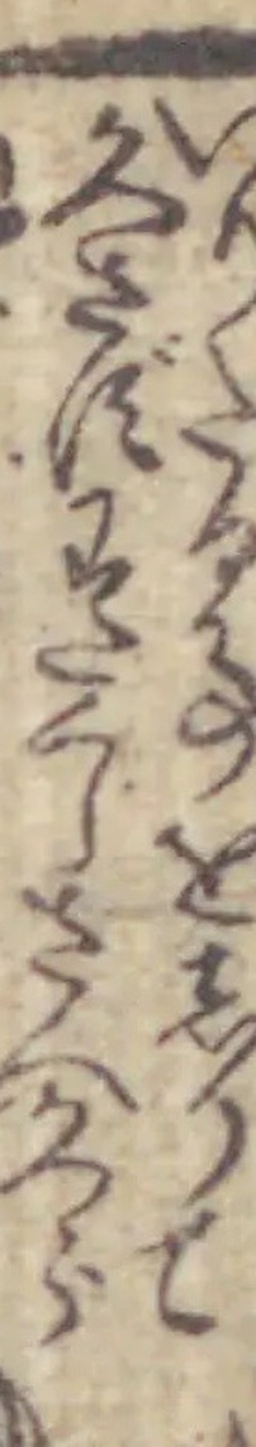かへさずわたくしさへかへら
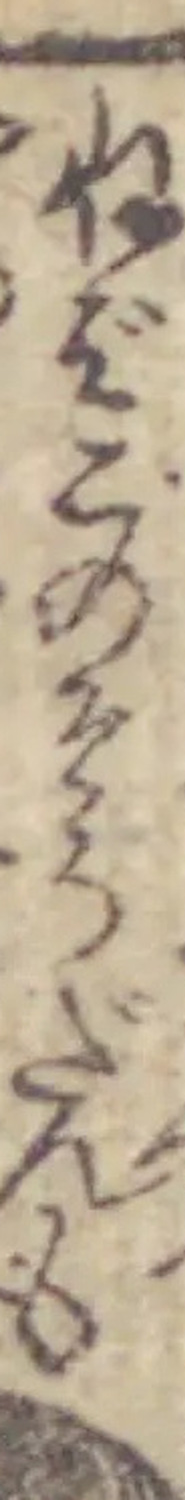ねばこのそうだんも
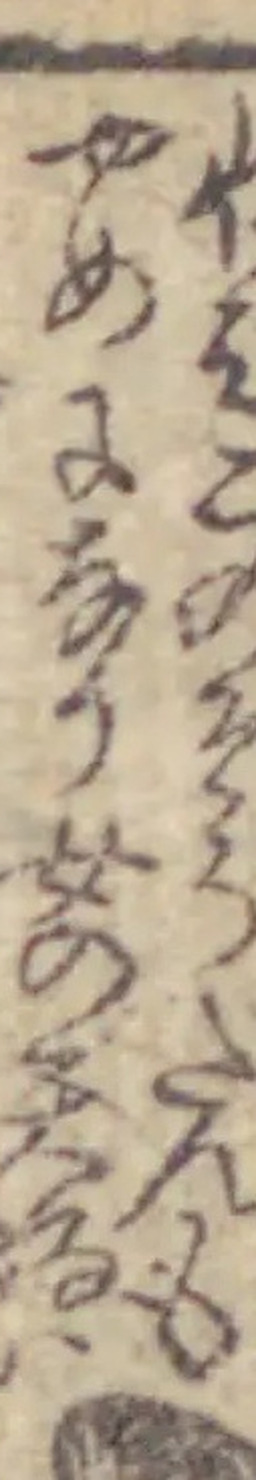やめになり女の天狗は
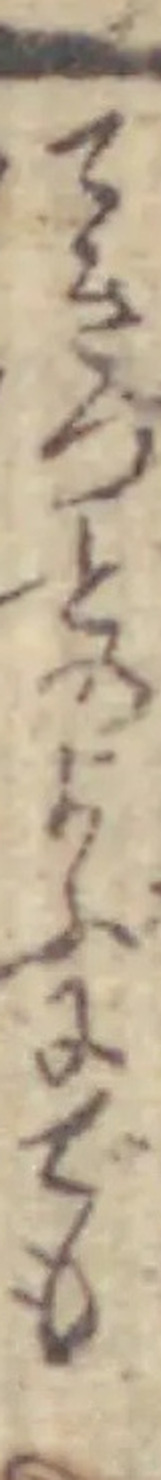てきづとのようにでも
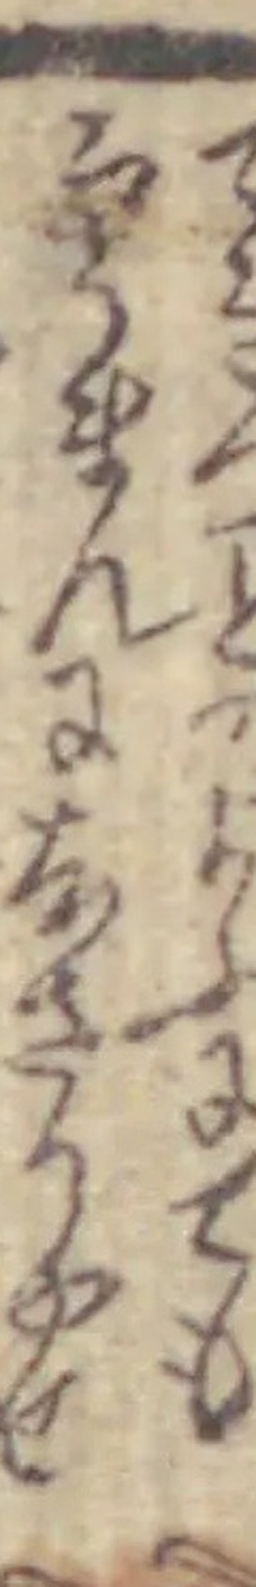こうまんになさりやせ
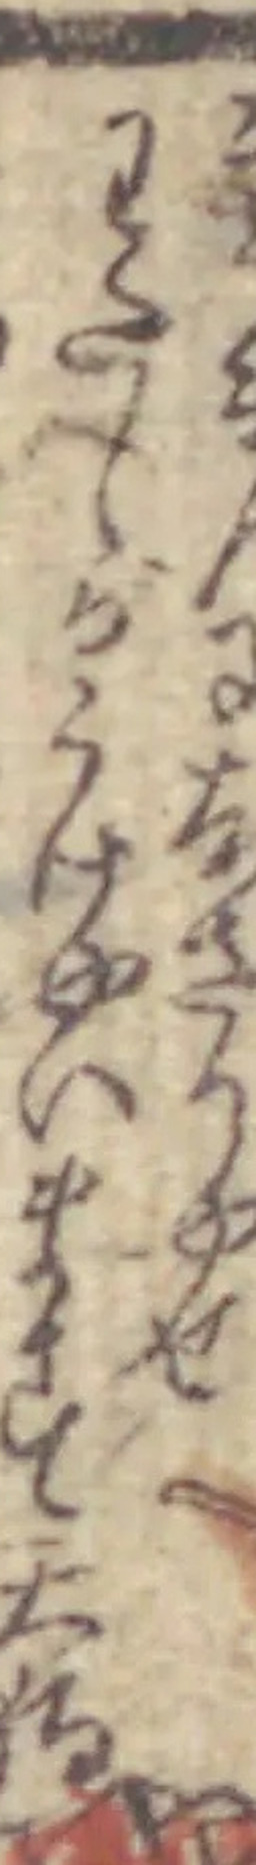わたしがうけやいます天狗
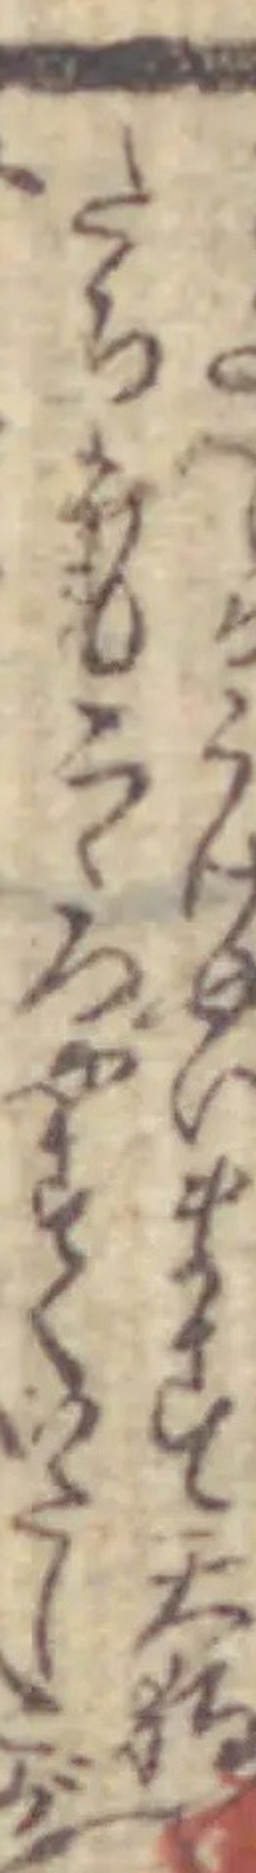たちもこゝろやすくいたしたが
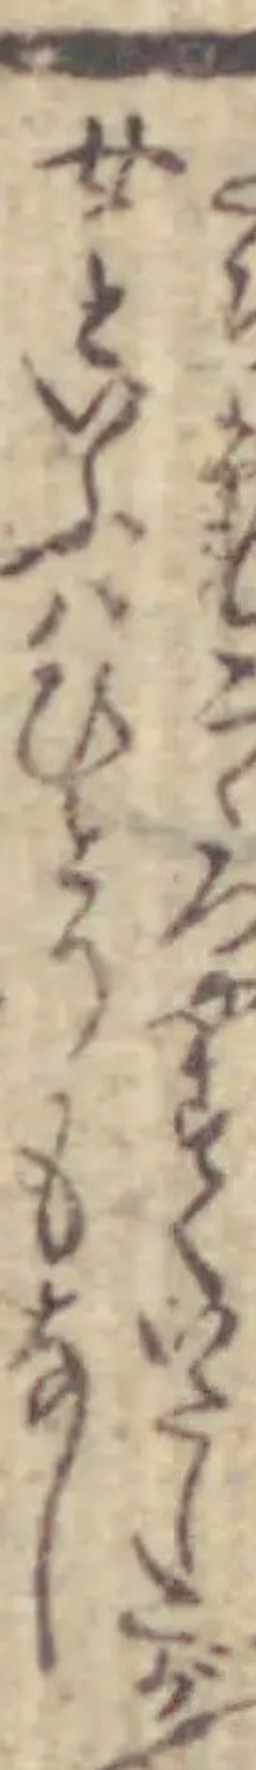女といふはひとりもなし
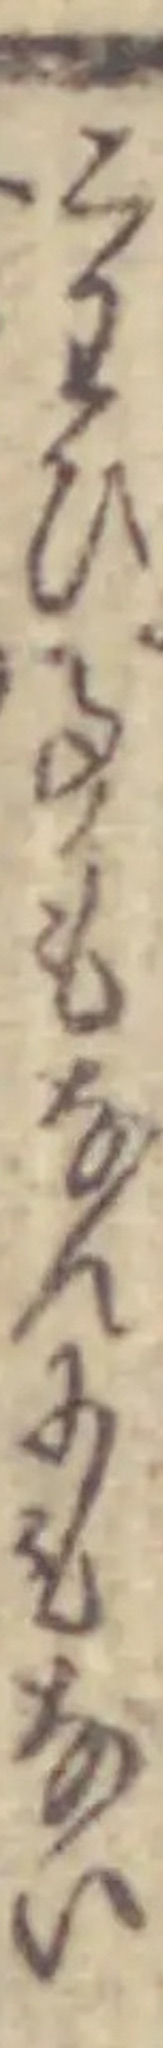こわひ事もなんにもない
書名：珍説女天狗 2巻
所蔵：国立国会図書館 National Diet Library, JAPAN
